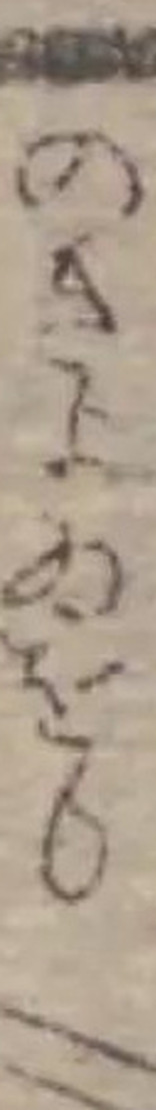のきよゐをも

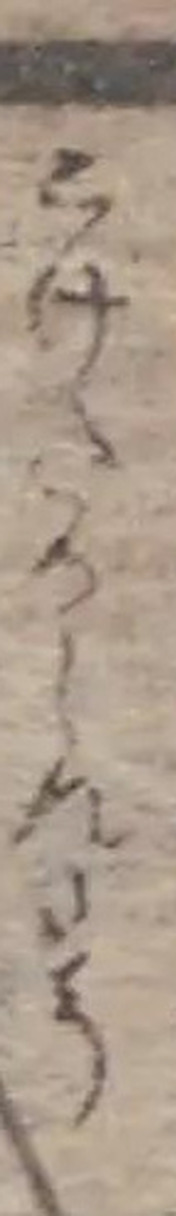こけたかしんわう
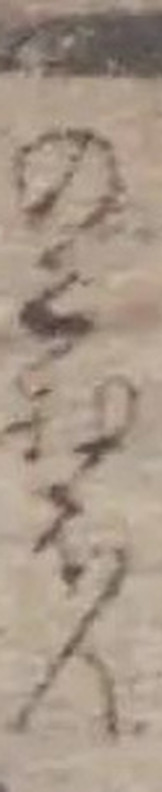のこむほん
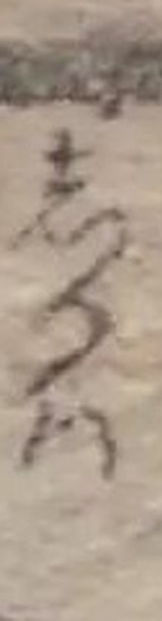しかは
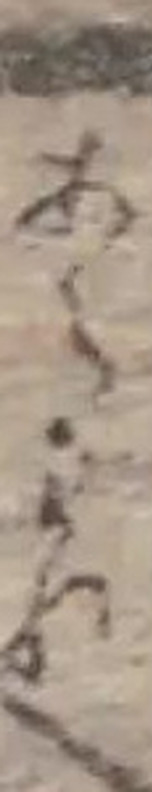あらわれ
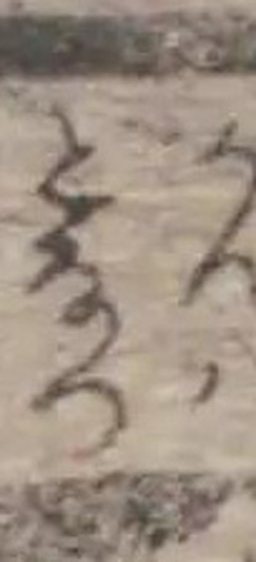となつ
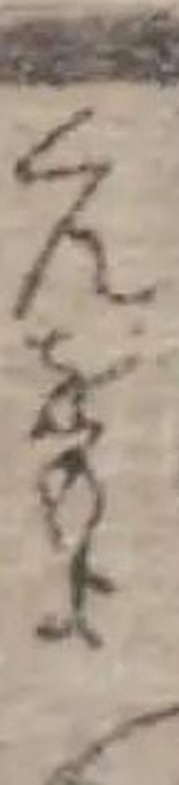くんをもよ
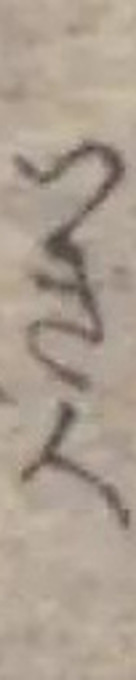いき人
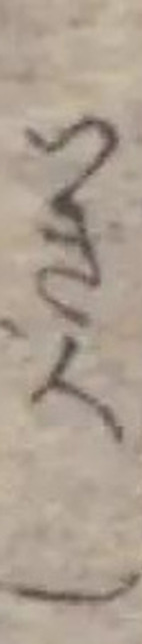いき人
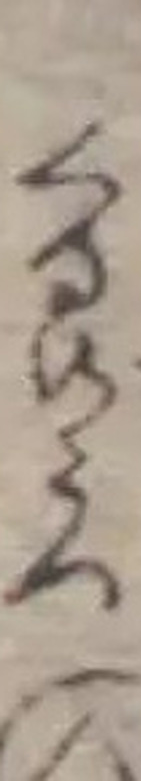くるひたつ
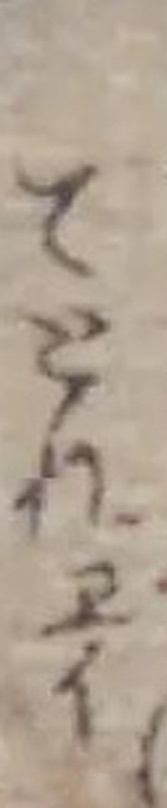てとれヱイ
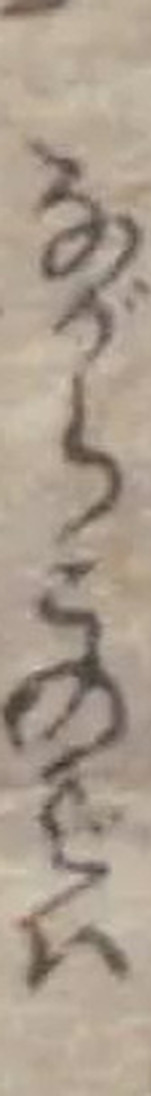ながらこのばは
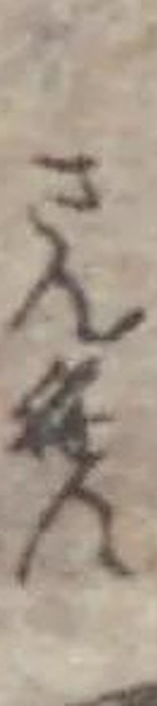さんねん
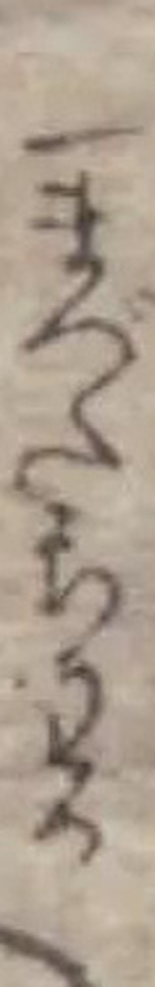一まづたちわか
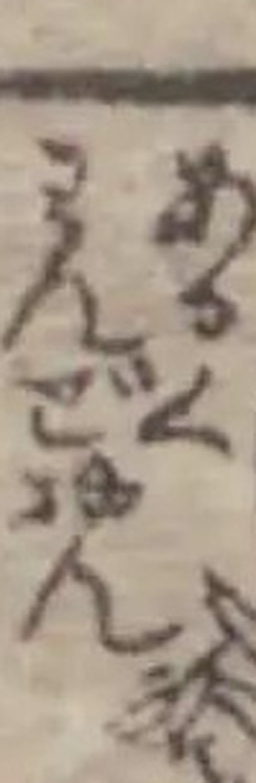わんぜおん
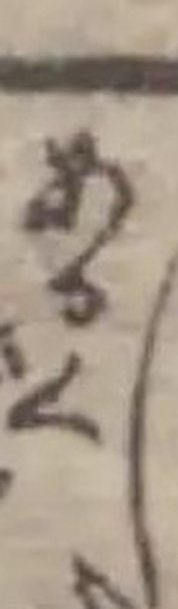あるく
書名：富多高慢噺 3巻
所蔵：国立国会図書館 National Diet Library, JAPAN
